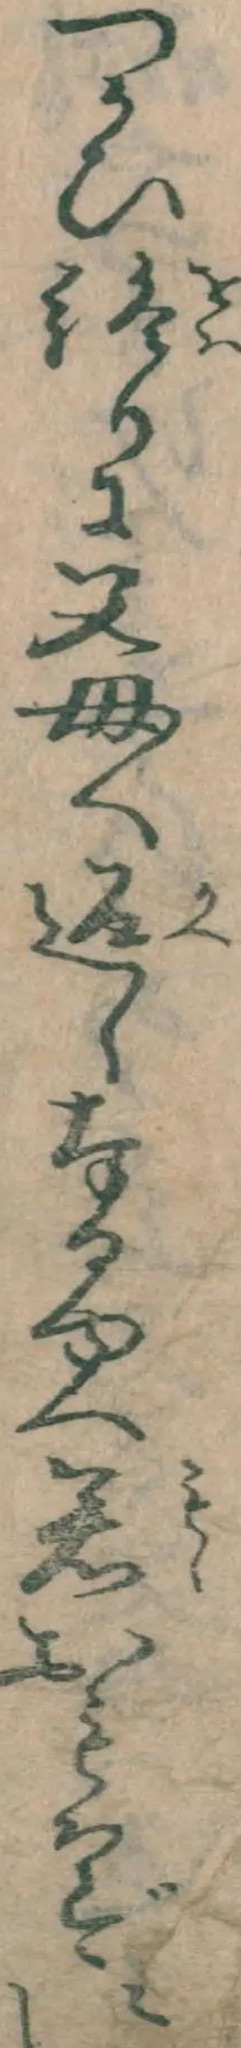つかひ終りに父母へ返し奉るゆへ若おもはずに

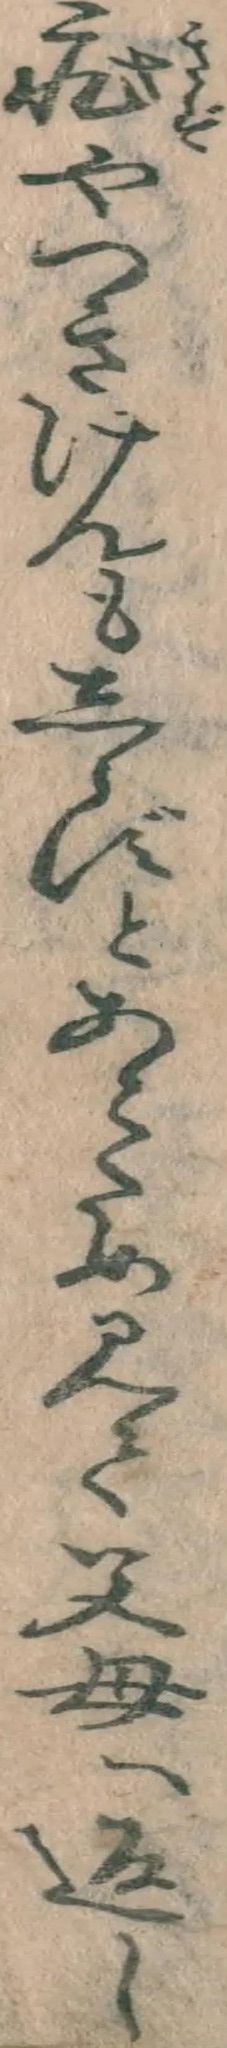疵やつきけんもしらずとあらため見て父母へ返し
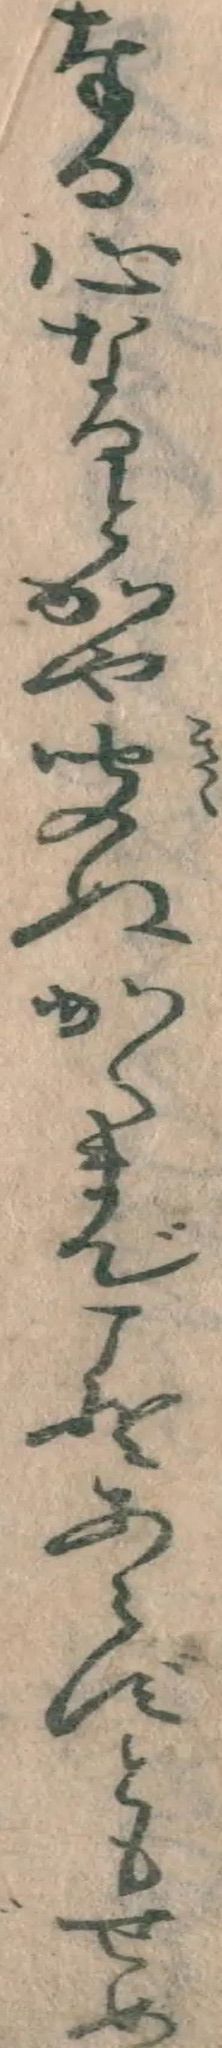奉る心なるとかや聞ぬかくまでこそあらずともせめ
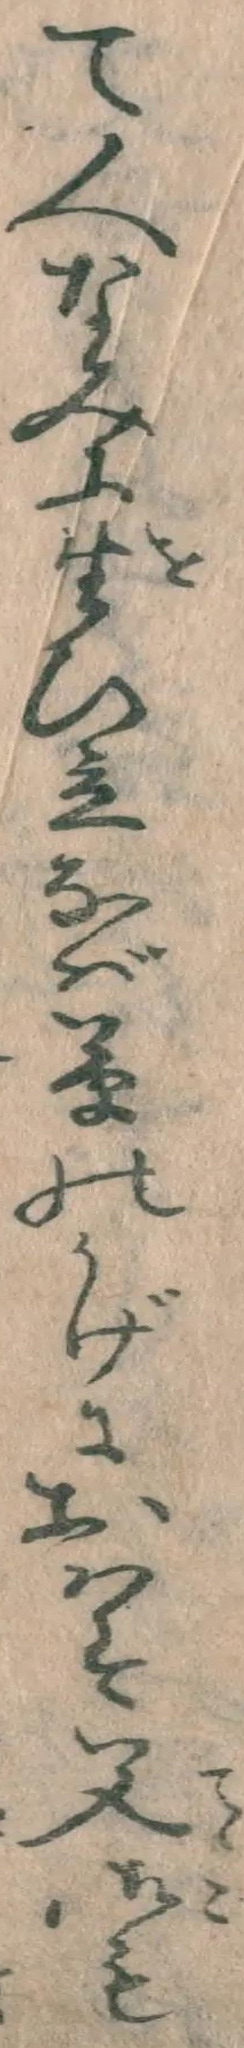て人なみに生ひ立なば草のかげにおはす父御も
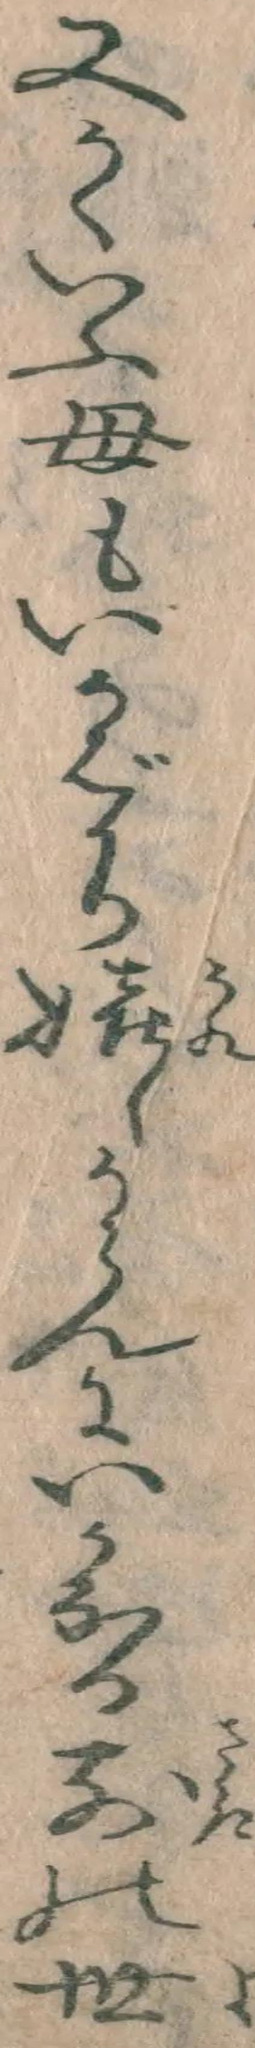又かくいふ母もいかばかり嬉しからんにいかなる前の世
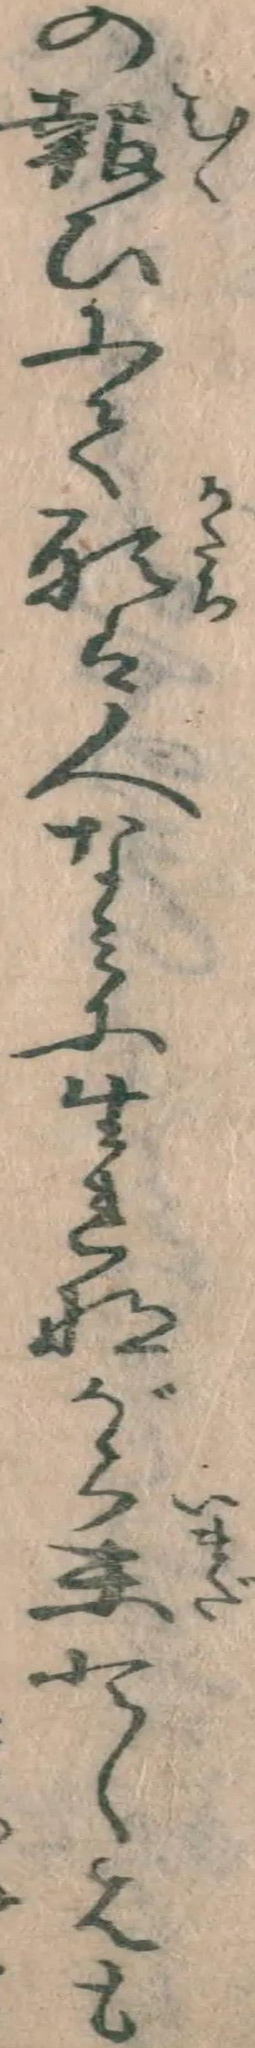の報ひにて形は人なみに生れながら未としはも
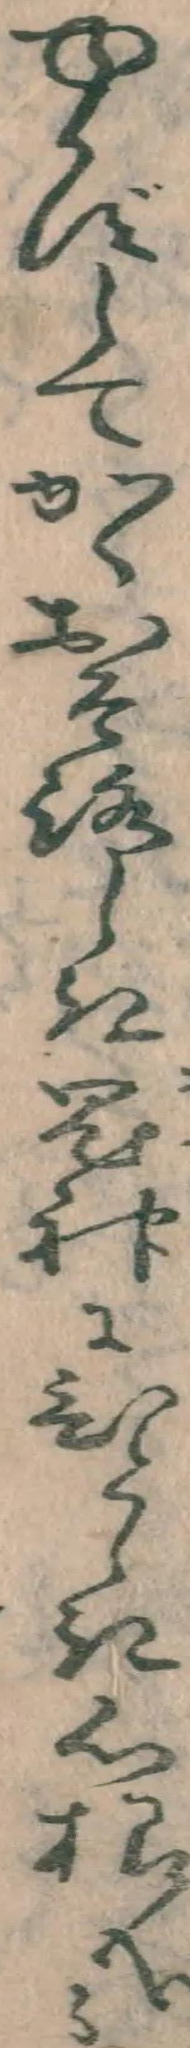ゆかずしてかくおそろしき鬼神にひとしき心根哉
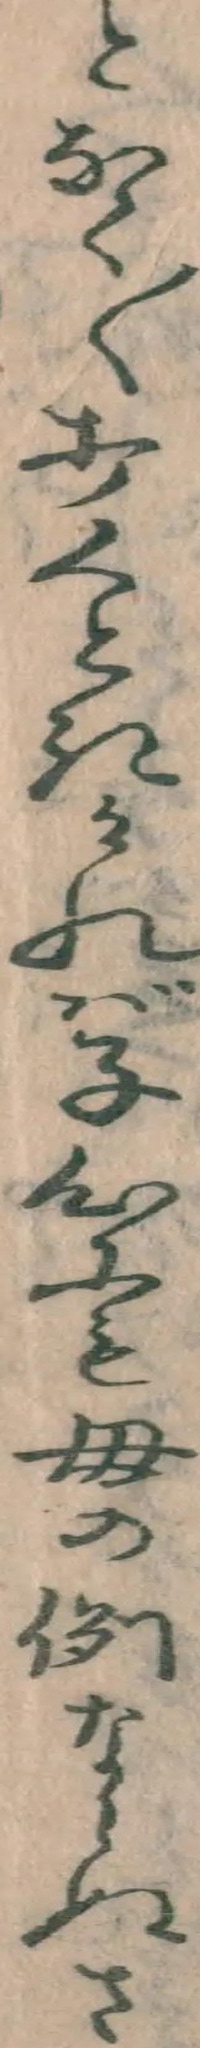となく〳〵打くときければ子心にも母の例ならぬさ
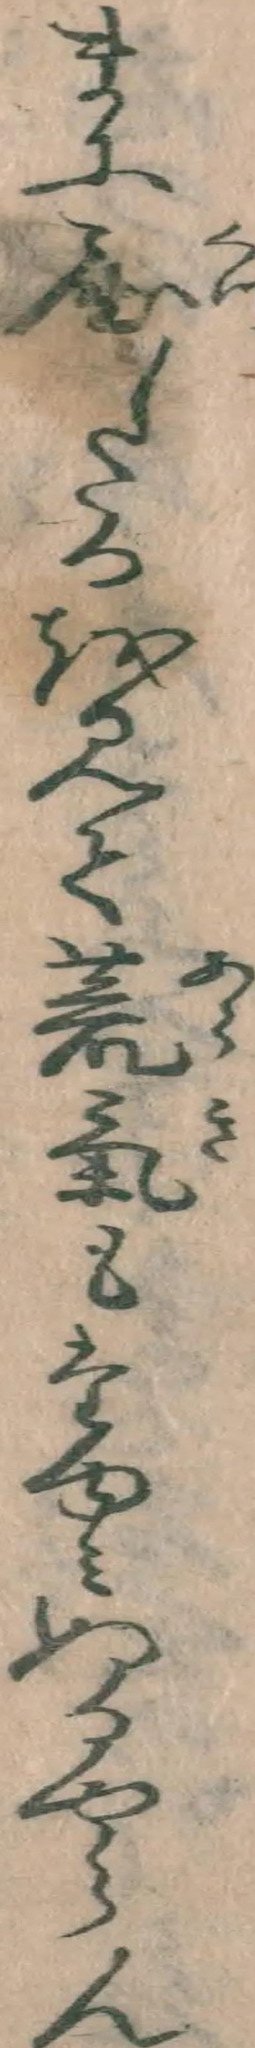まに屈したるを見て荒気もたゆみぬるやらん
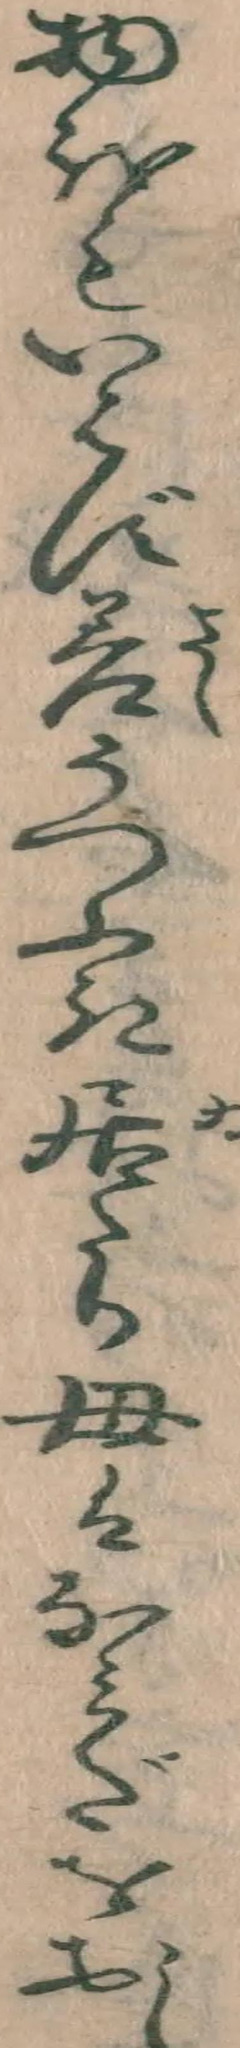物をもいとはず差うつふき居たり母はなみだをおし
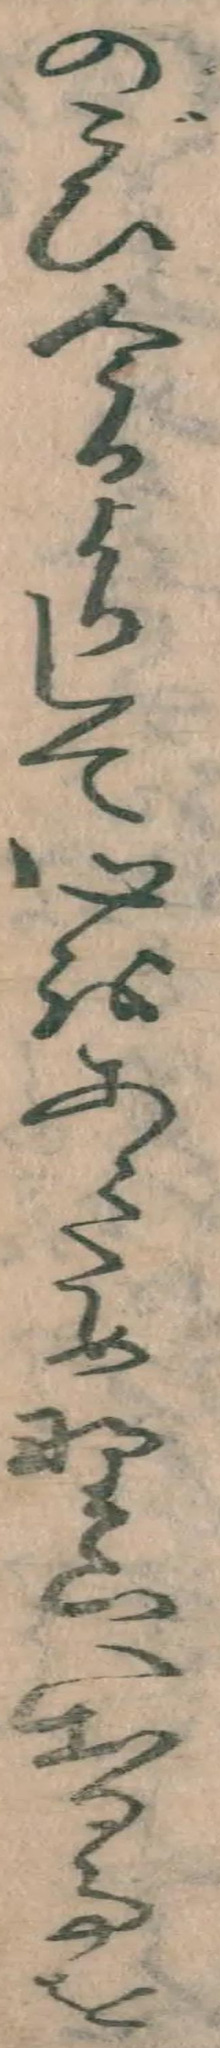のごひ今日よりして心をあらため野山へ出る事を
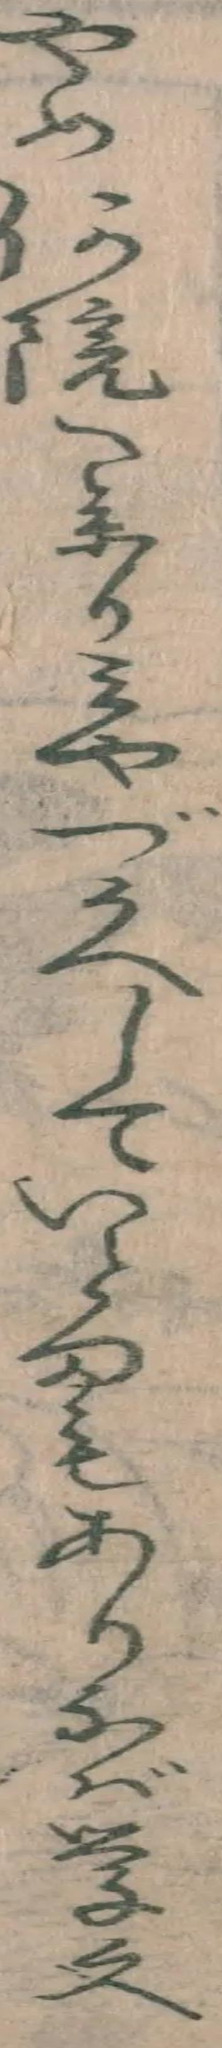やめ何院へ参りみやづかへしていとまもありなば学文
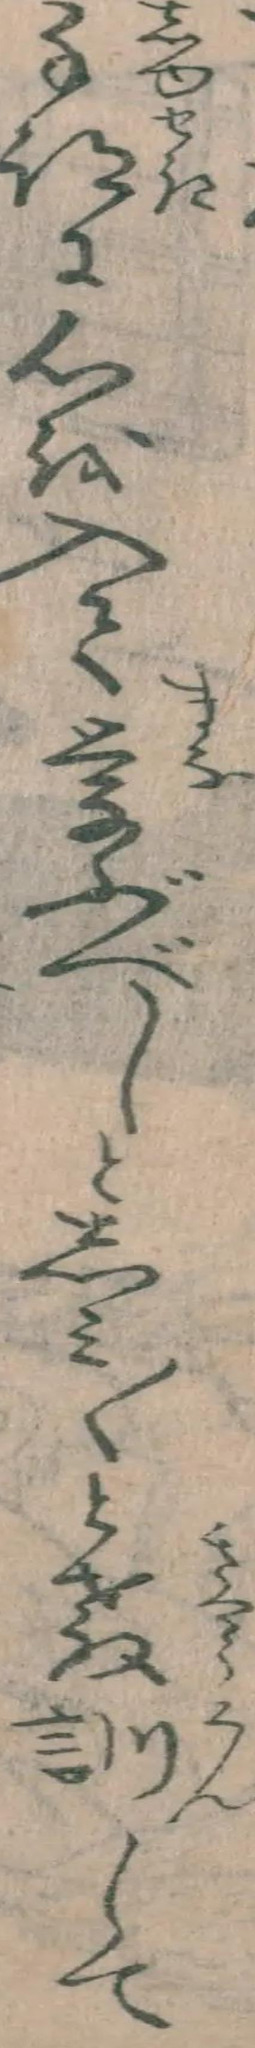手跡に心を入て学ぶべしとしみ〳〵と教訓して
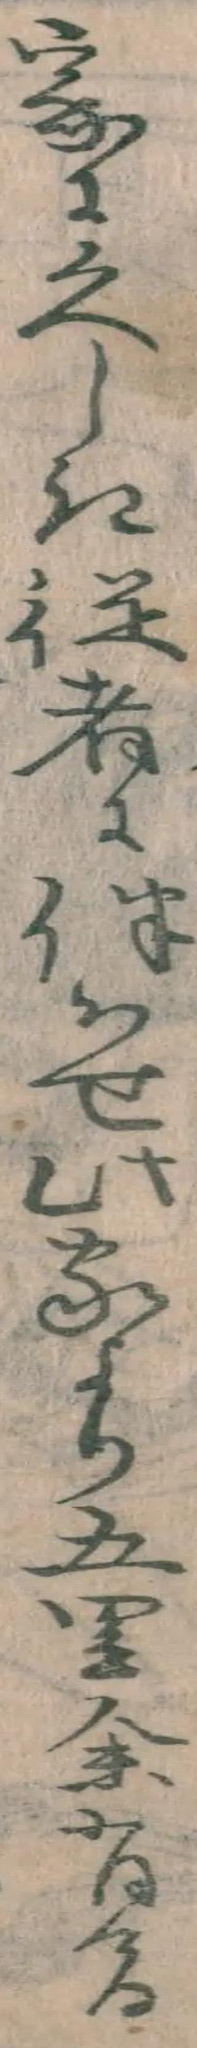家に久しき従者に伴はせ此家より五里余有ける
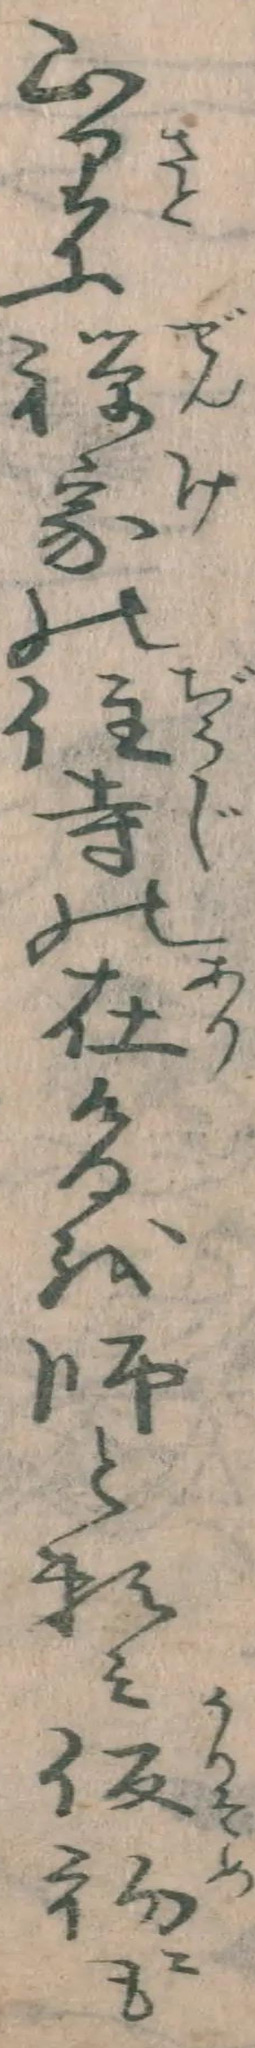山里に禅家の住寺の在けるを師と頼み仮初
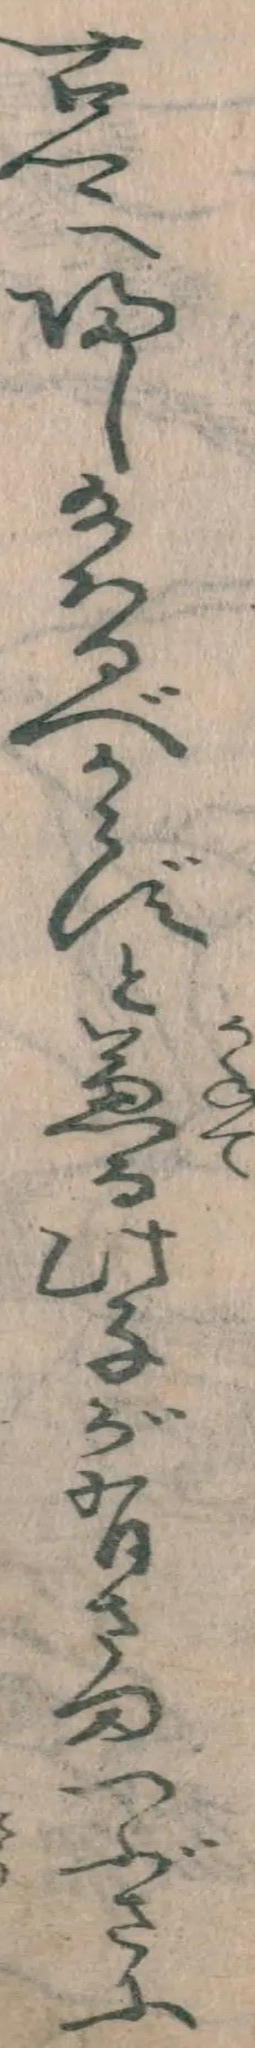古郷へ帰し給はるべからずと兼か此子が有さまつぶさに
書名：怪談御伽童 5巻. [1]
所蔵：国立国会図書館 National Diet Library, JAPAN
